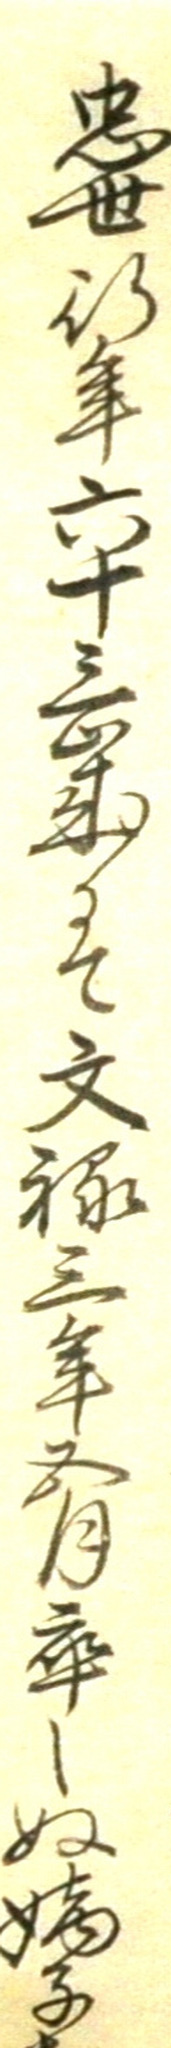忠世行年六十三歳にて文禄三年五月卒しぬ嫡子相模
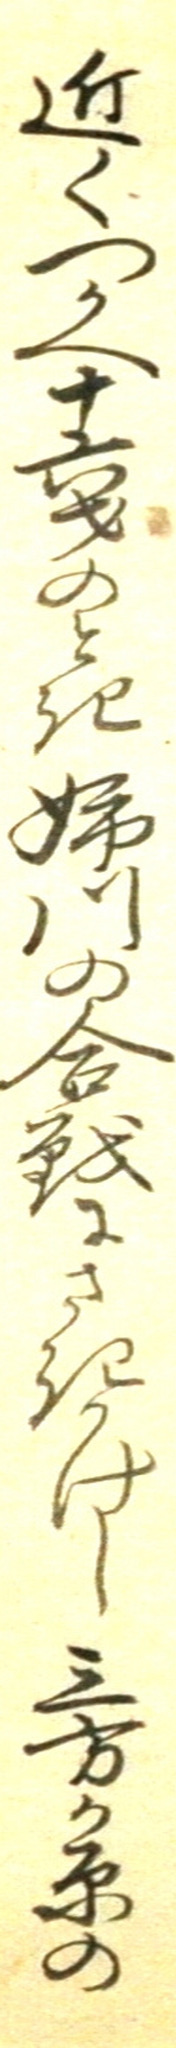近くつかへ十六才のとき姉川の合戦にさきかけし三方か原の
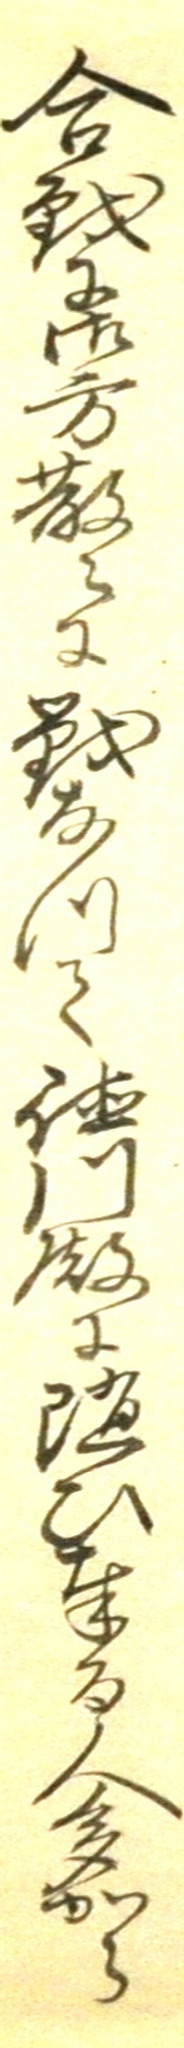合戦に御方散々に戦なつて徳川殿に随ひ奉る人多から
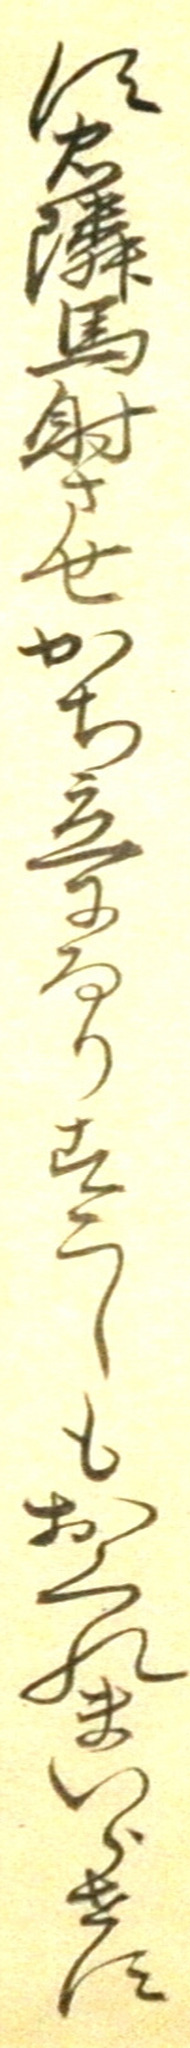す忠隣馬射させかち立になりすこしもおくれまいらせす
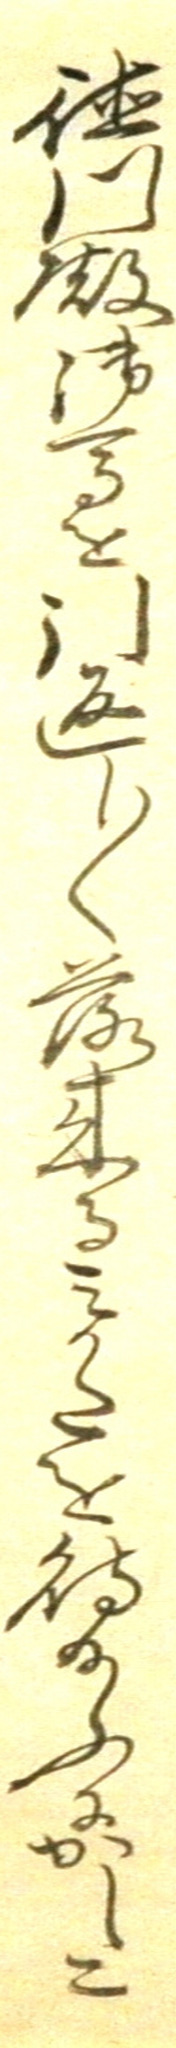徳川殿御馬を引返し〳〵落来るみかたを待給ふにかしこ
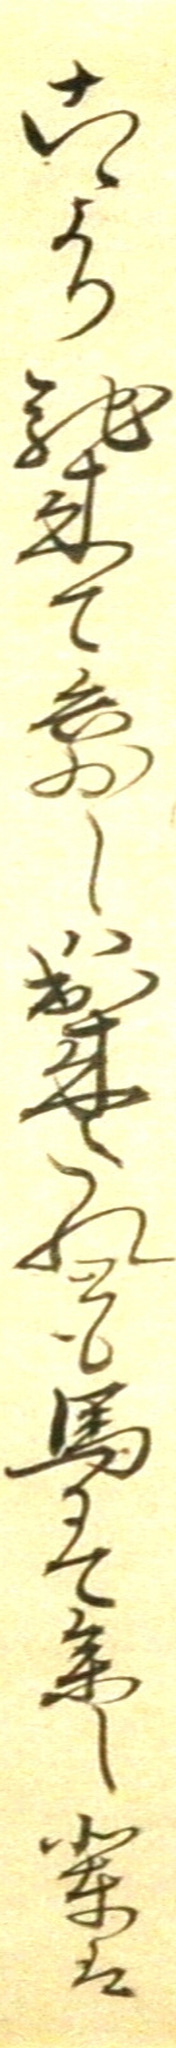こゝより馳来て兵少しは出来たれとも馬にて参し輩は
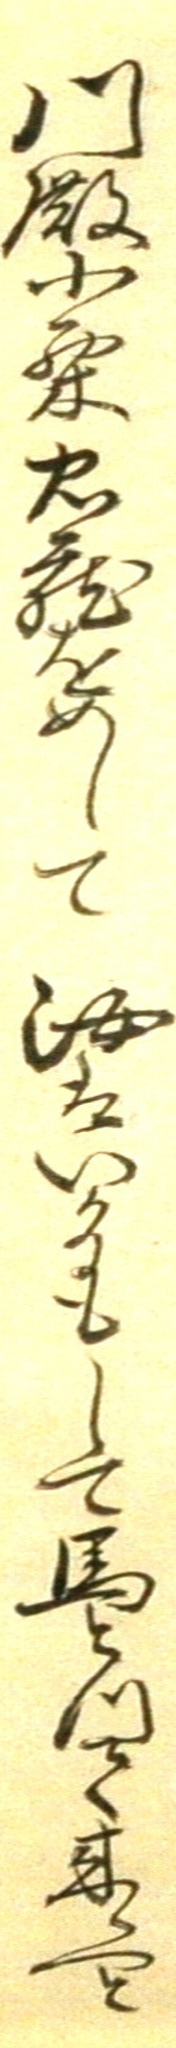川殿小栗忠蔵をめして汝はいかにもして馬とつて来候へと
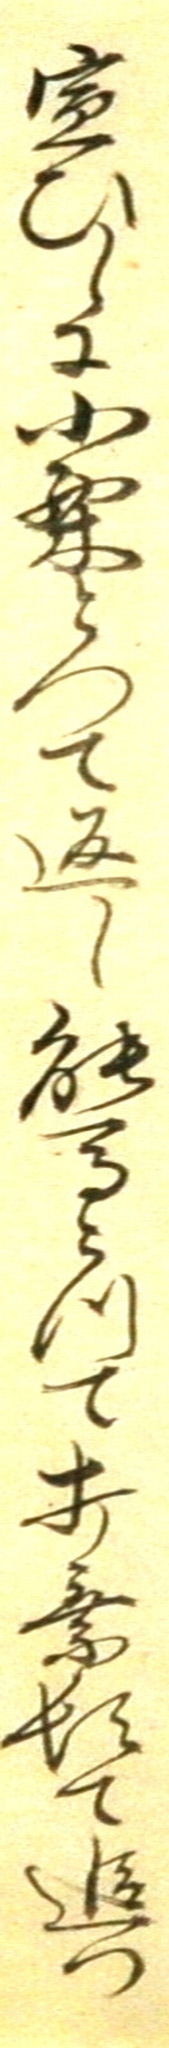宣ひしに小栗とつて返し能馬とつて打乗頓て追つ
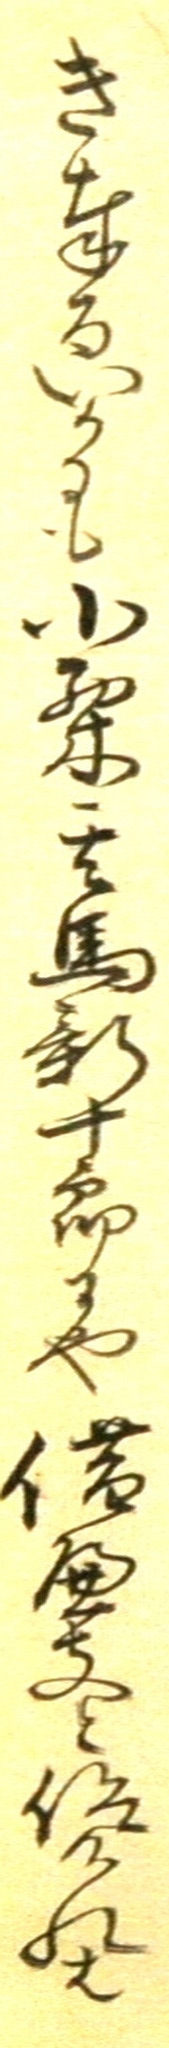き奉るいかにも小栗其馬新十郎にや借へきと仰けれは

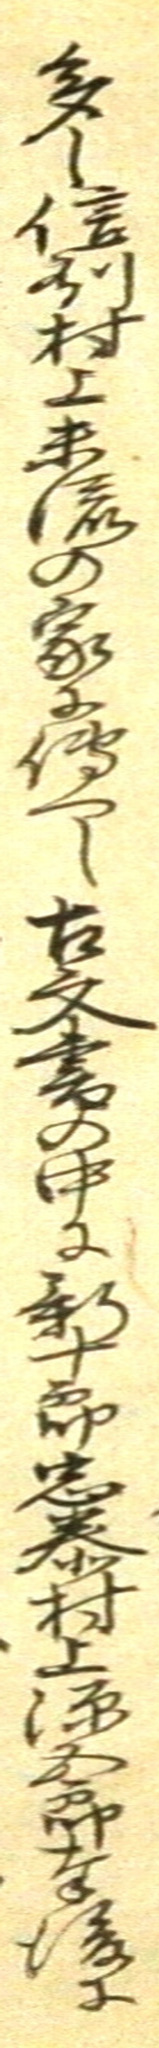多し信州村上末流の家に伝へし古文書の中に新十郎忠泰村上源五郎奉後に
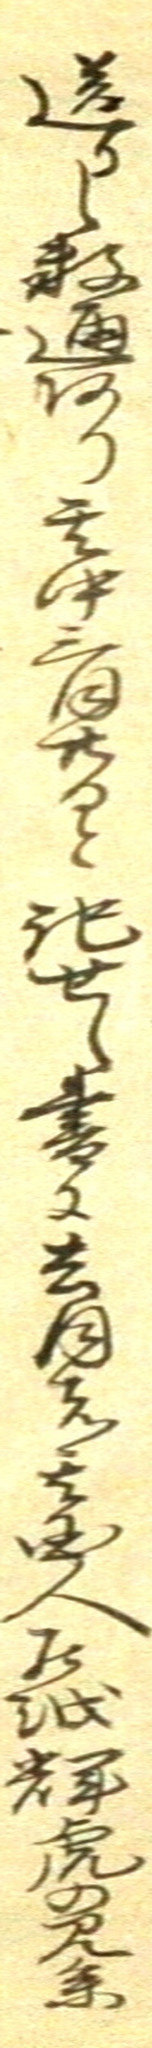送りし数通あり其中三月廿日と記せし書に去月者其国へ罷越輝虎の見参
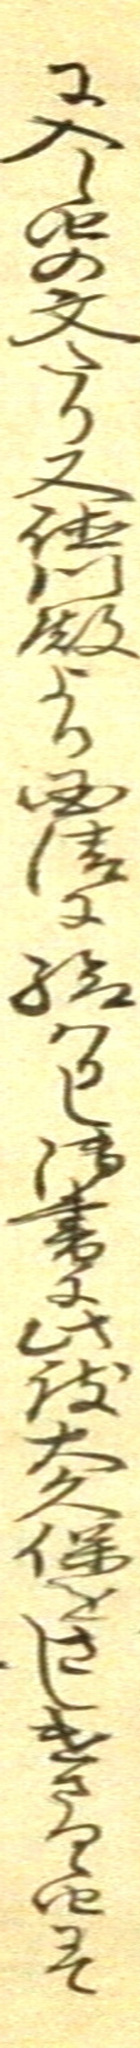に入し由の文たり又徳川殿より国清に給はりし御書に此度大久保をさし遣さるゝ由にて
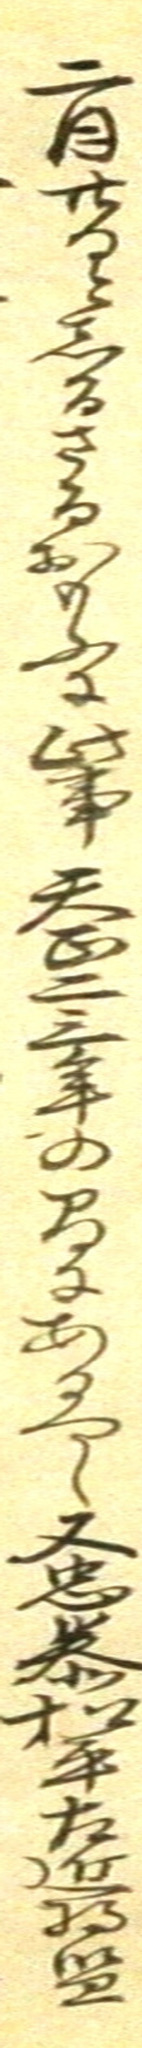二月廿日としるさるおもふに此事天正二三年の間にあるへし又忠泰松平左近将監
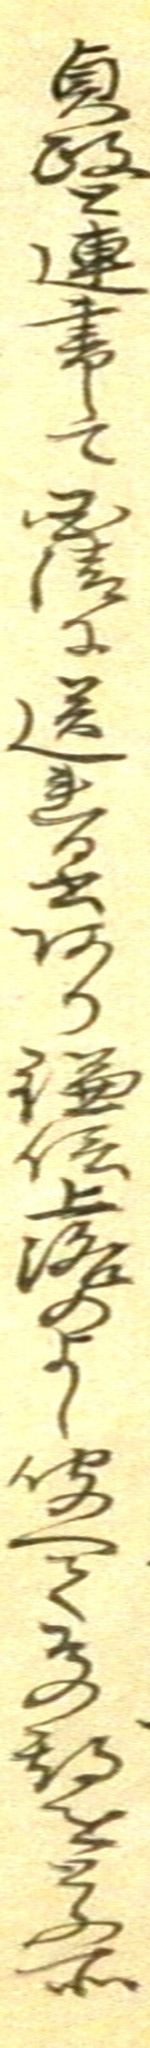貞政と連書して国清に送れる書あり鎌信上洛のよし聞へてその期をとふ所
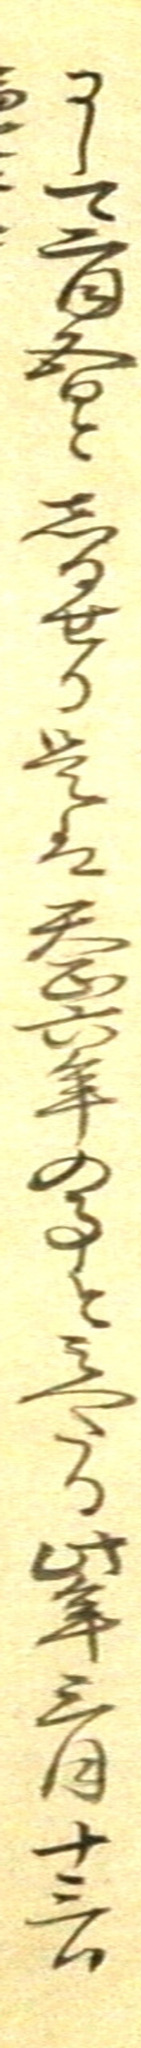にして二月五日としるせり是は天正六年の事とみへたり此年三月十三日
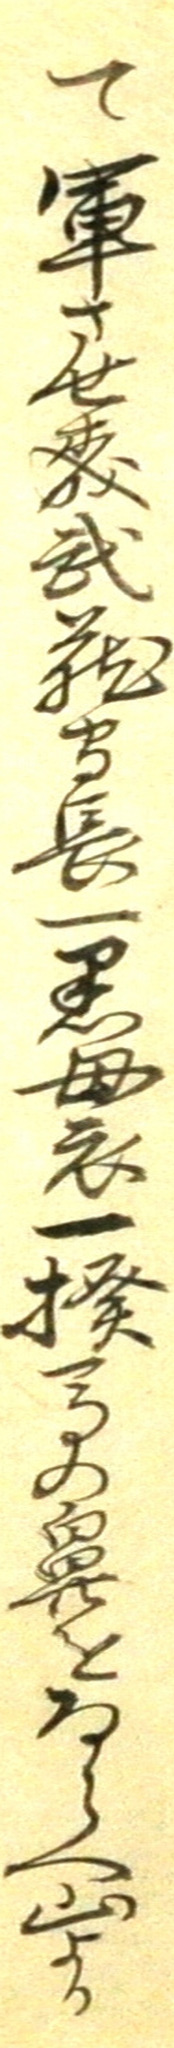て軍させ森武蔵守長一黒母衣一揆馬の鼻をならへ山より
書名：藩翰譜（四・中）
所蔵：伊那市立高遠町図書館・合同会社AMANE
